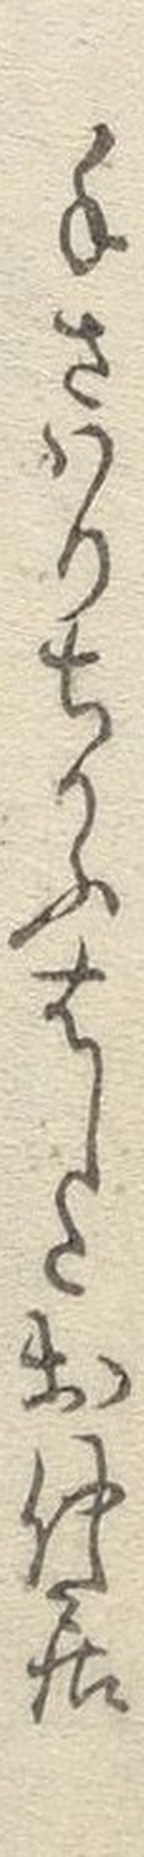てさはりちかふはしたお仲井
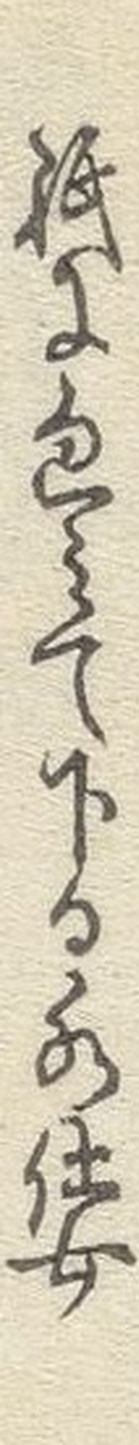紙に包みて下る水仕女
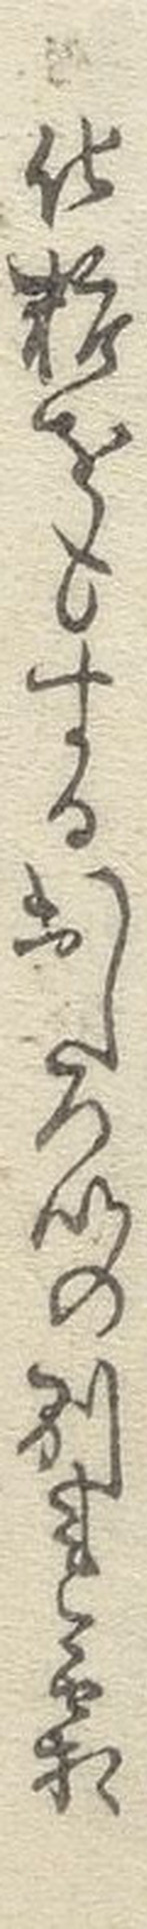化粧をもするおしろいの別れ霜
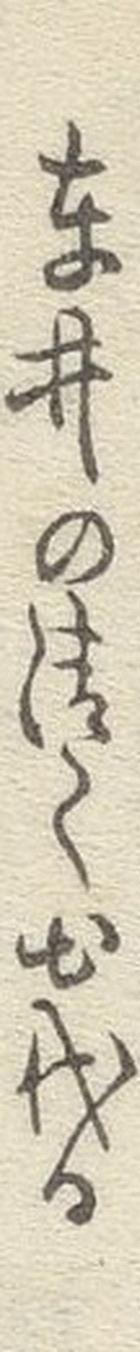東井の清く出代る
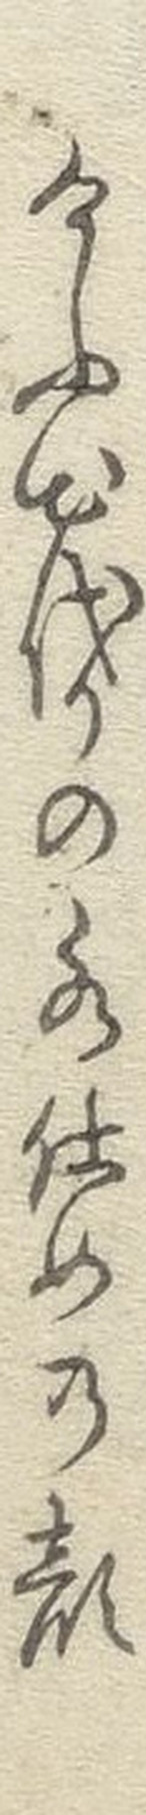けふ出代りの水仕女の顔
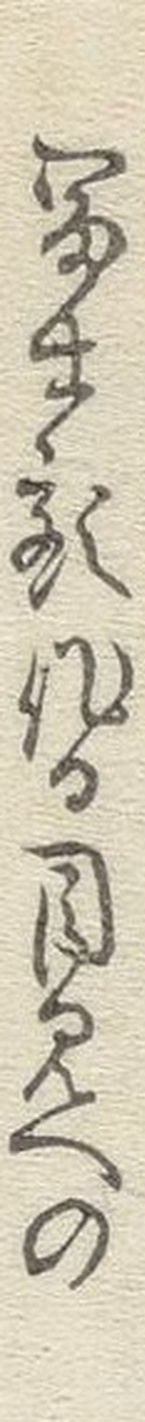富士額作る目見への
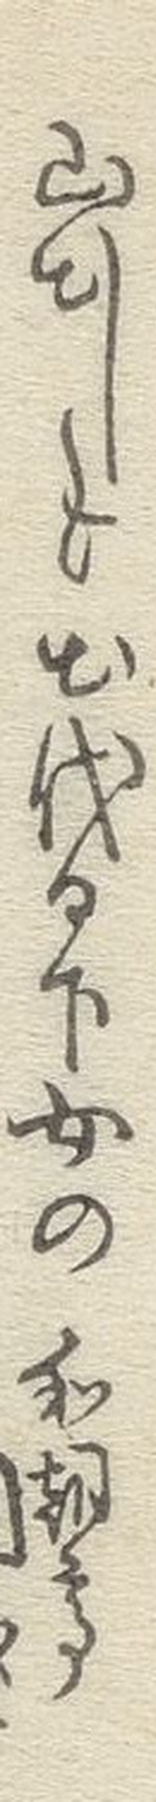山出しも出代る下女の和朝亭
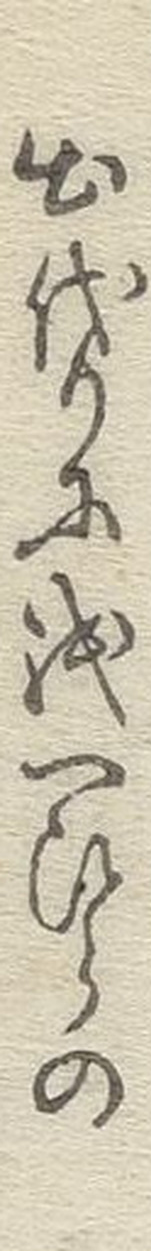出代りに紙一ひらの
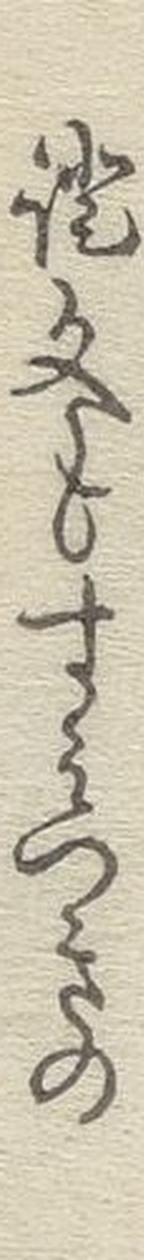證文もすみつきの
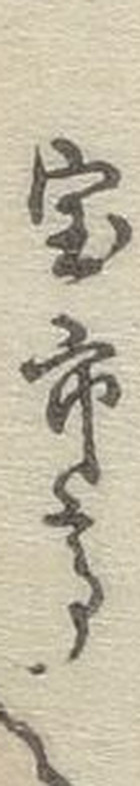宝市亭

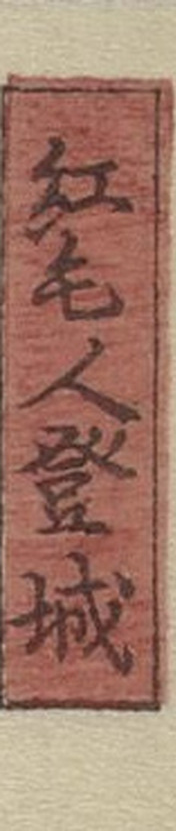紅毛人登城
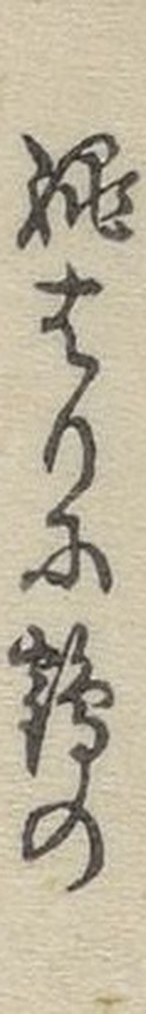縄はりに鶴の
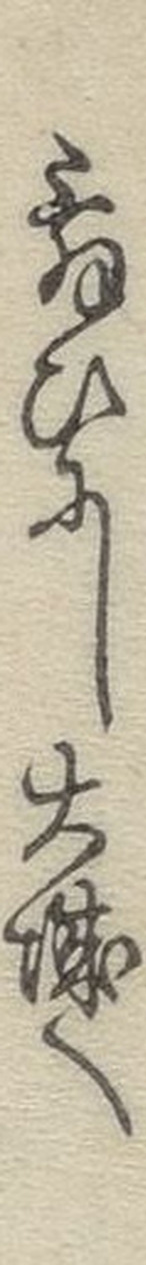舞ひにし大城へ
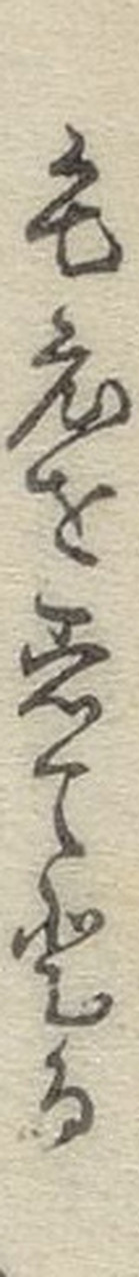毛衣を着て登る
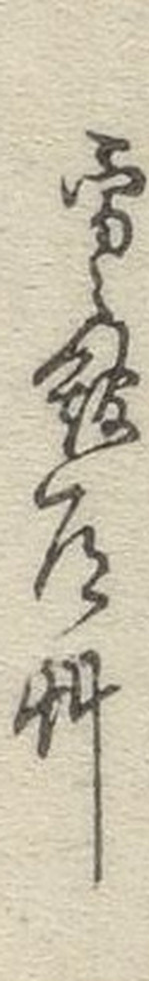勇々館道草
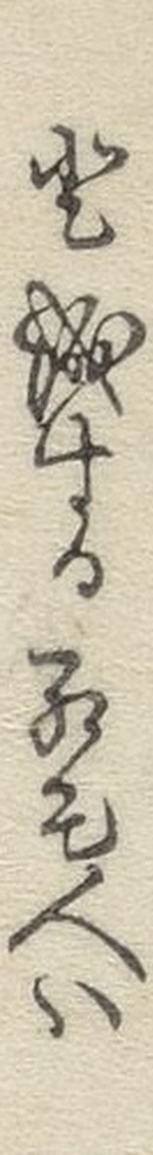登城する紅毛人は
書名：Picture Album of People with Kyōka (Light Verse) (Kyōka shiki jinbutsu 狂歌四季人物)
